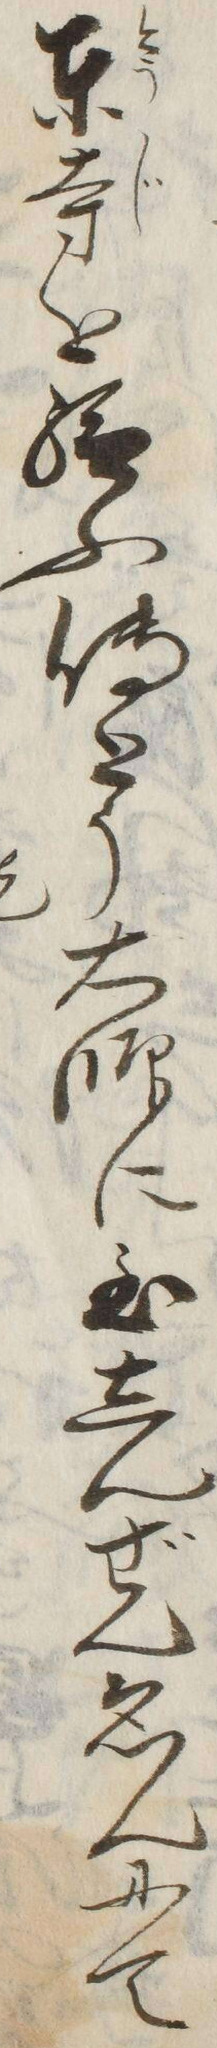東寺を給ふ伝とう大師に至しんぜんゑんにて
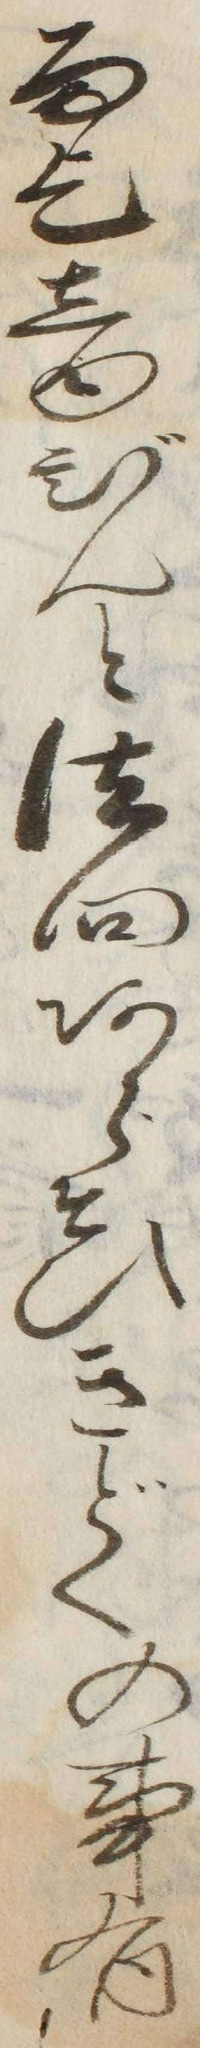雨乞しゆびんと法問あらそひきどくの事有
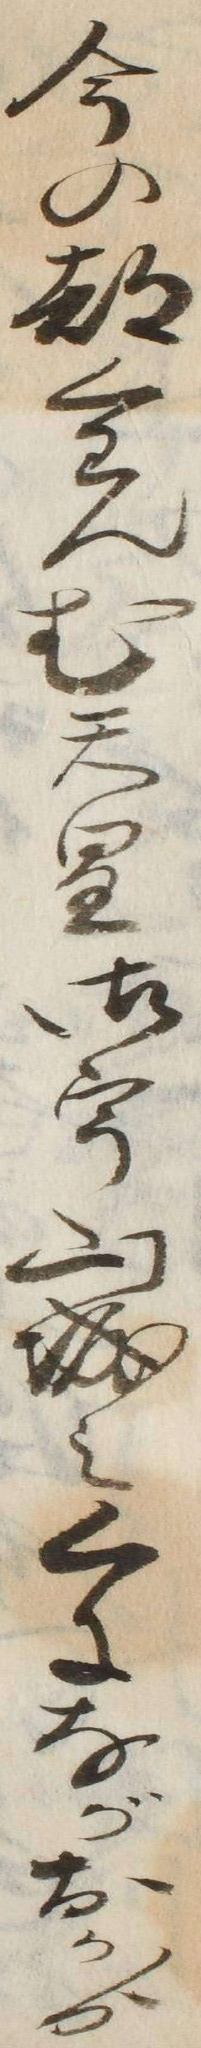今の都くわんむ天皇御宇山城之くにながおかより
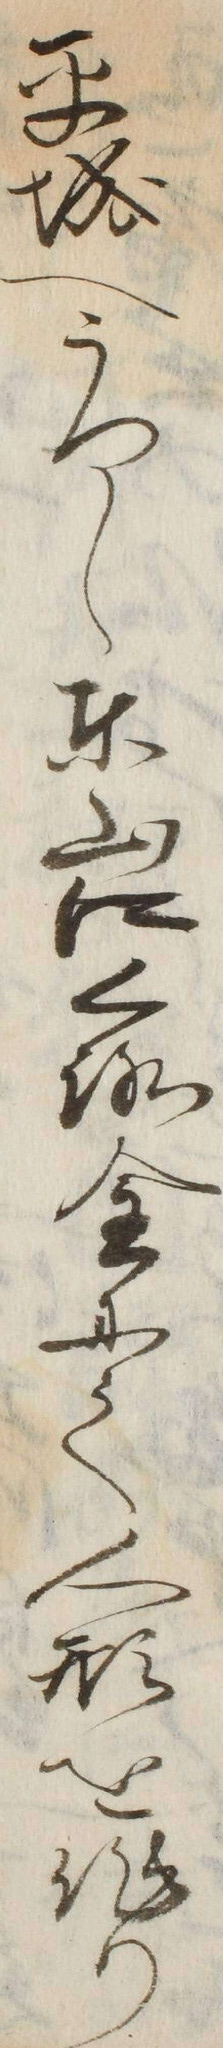平城へうつし東山にくろ金にて人形を作り
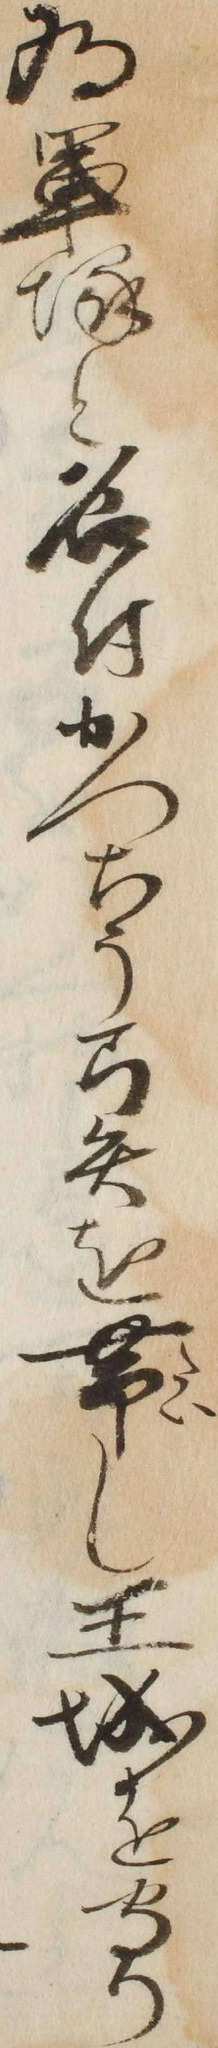将軍塚と名付かつちう弓矢を帯し王城を守り
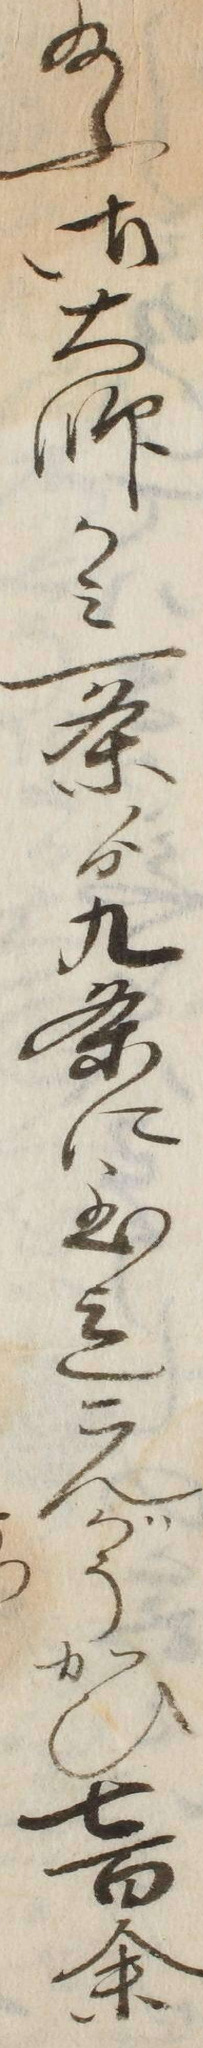給ふ御大師かみ一条より九条に至迄こんがうかひ七百余
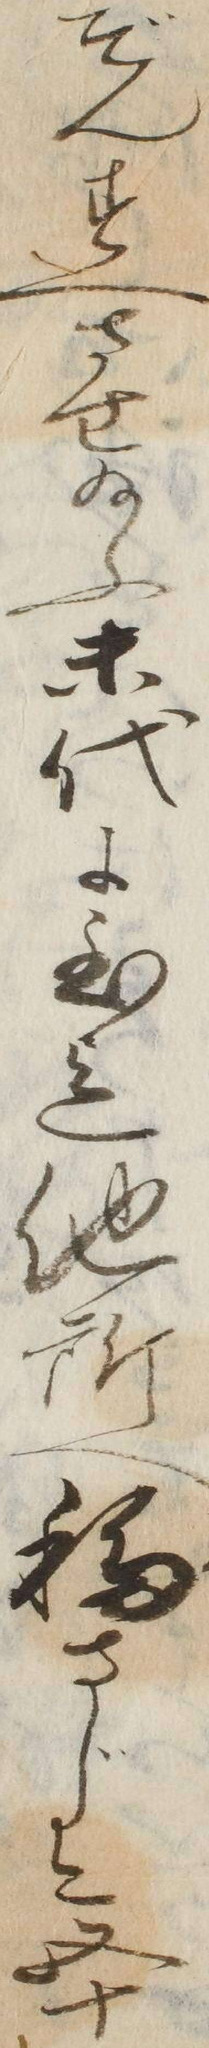ぞんすへさせ給ふ末代に至迄他所へ移さじと五十
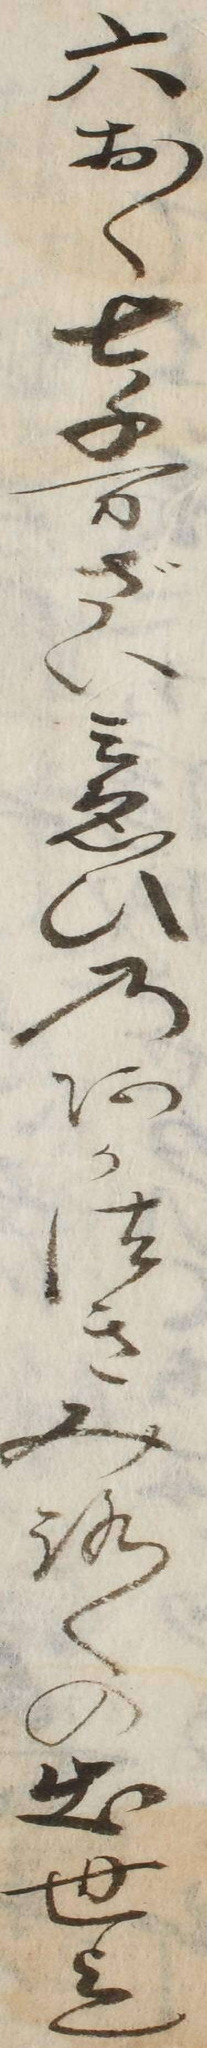六おく七千万ざいみゑひのあかつきみろくの出世迄
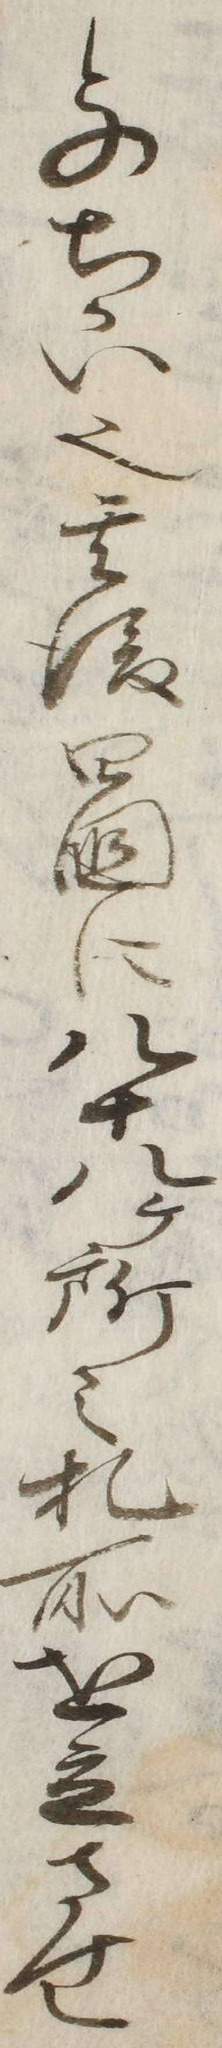とのちかい也其後四国に八十八ヶ所之札所を立させ
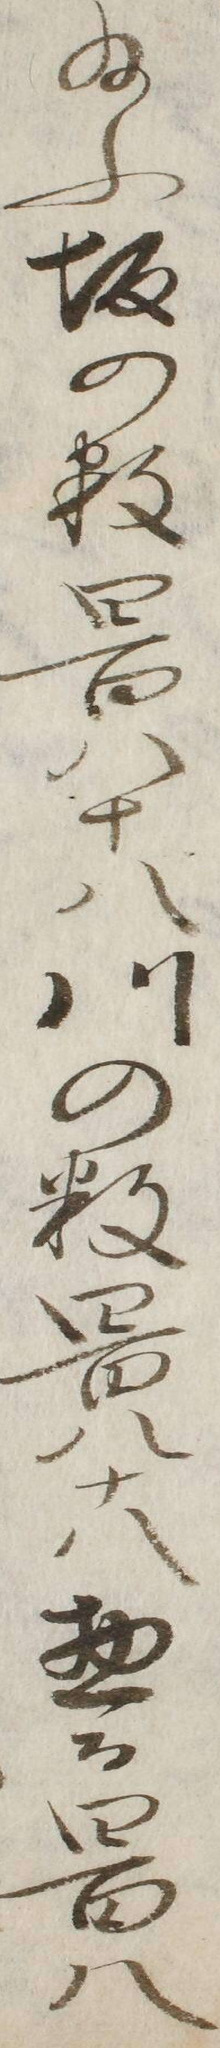給ふ坂の数四百八十八川の数百八十八惣て四百八
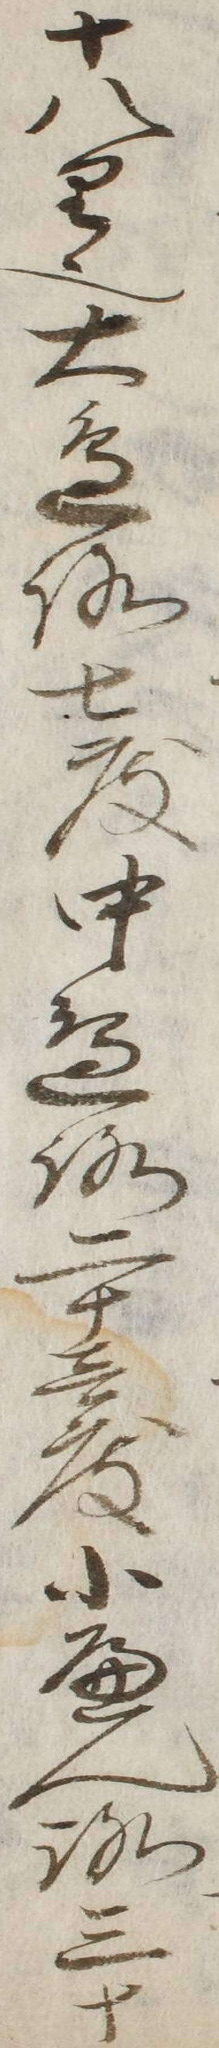十八里也大遍路七度中遍路二十壱度小へん路三十
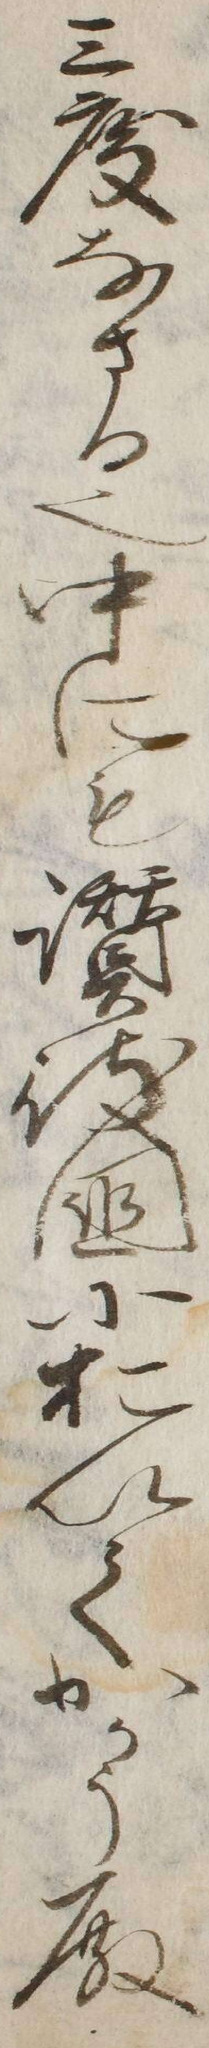三度なさる也中にも讃岐国においてかかう殿
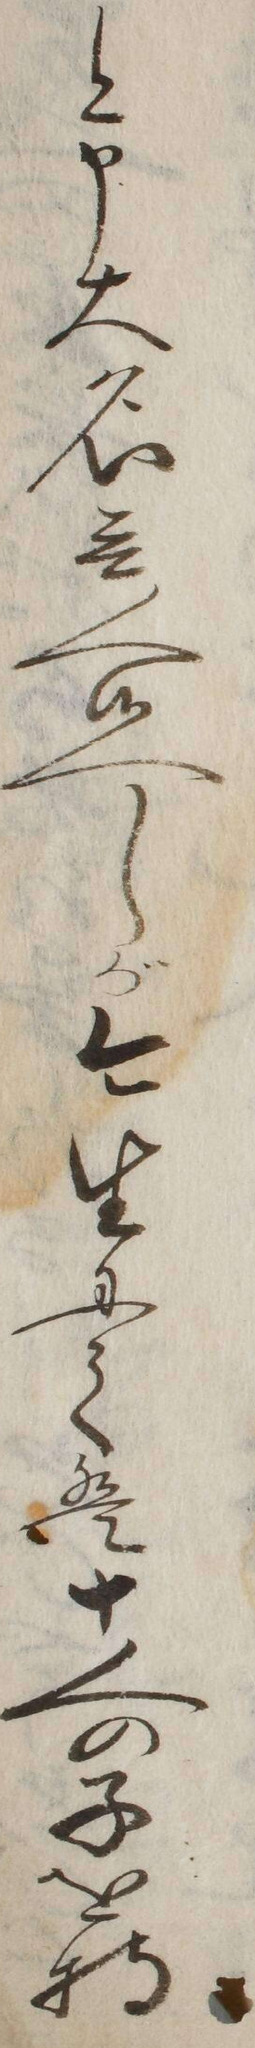と申大名壱人候へしが今生にては十人の子を持

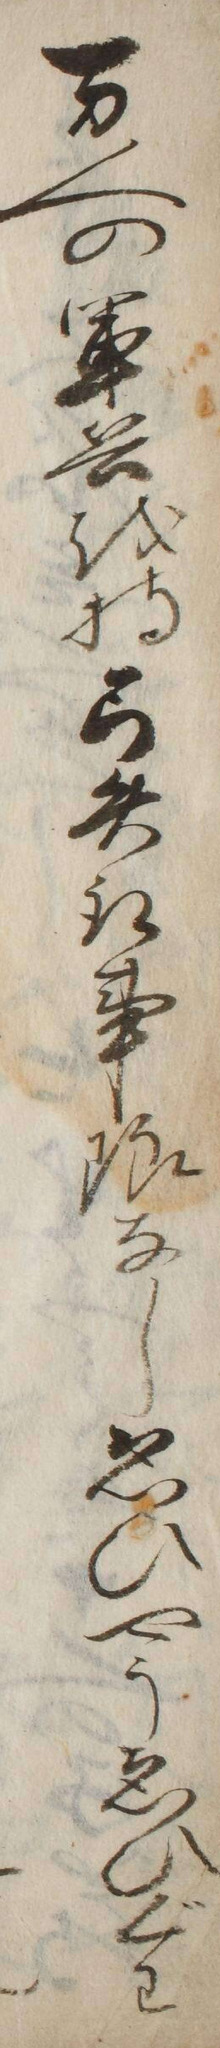万人の軍兵を持弓矢取事限なし思ひやうゑひぐわ
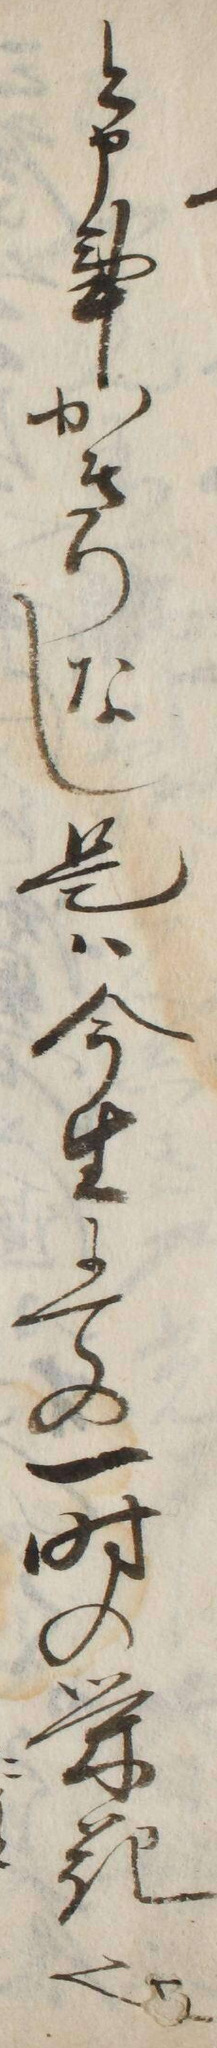と申事かきりなし是は今生にての一時の栄花也
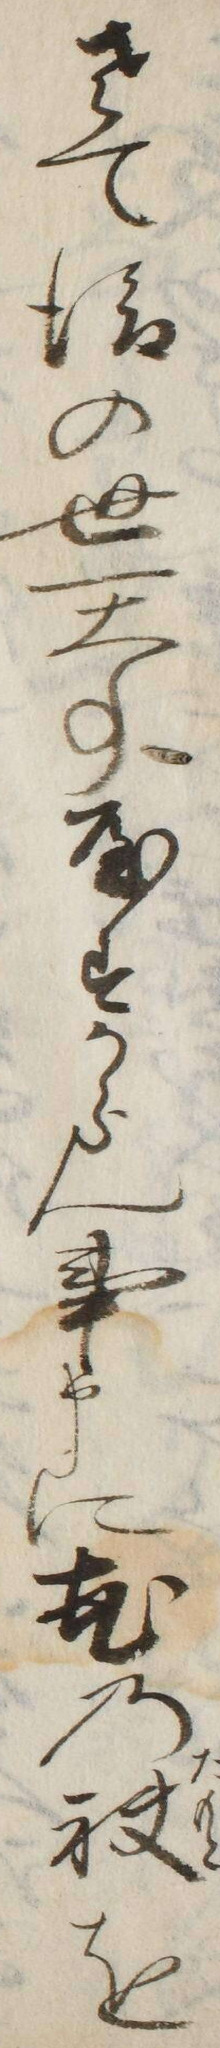さて後の世一大事やすからん事に花の袂を
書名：奉弘法大師御傳記
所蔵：国文学研究資料館
